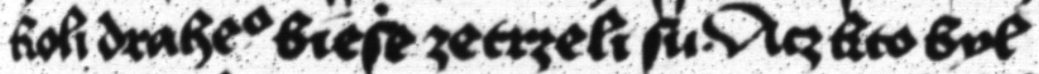koli drahe° bíeẛe zetrzeli ſu. Aczkto byl
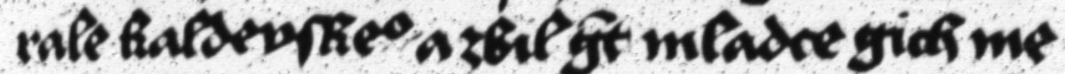árle kaldeyſke°, a zbil ḡt mladce gich me
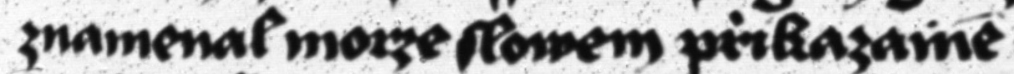znamenal morze ſlowem pṙikazaṅíe
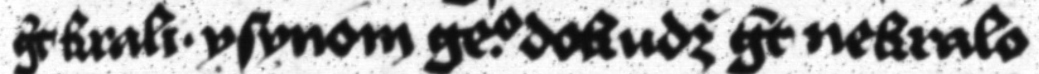ḡt krali. yſynóm ge° dokudž ḡt nekralo
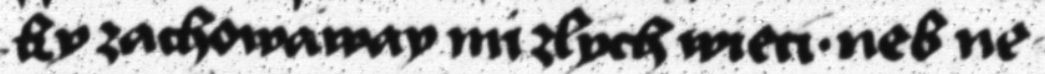ky zachowáway mi zlých wiecí. neb ne
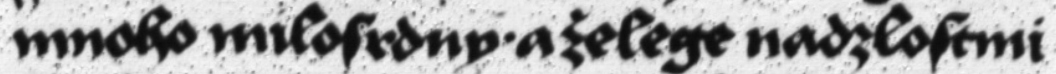mnoho miloſrdny. a želege nadzloſtmi
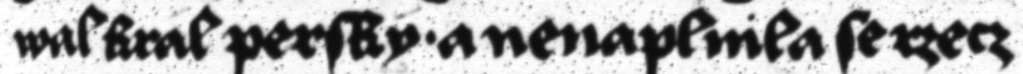wal král perḡký. a nenaplnila ſe rzecz
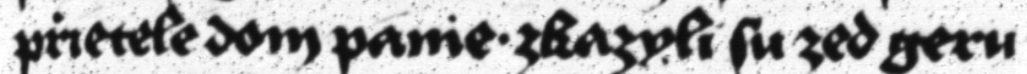přietele dóm pánie. zkazyli ſu zed geru
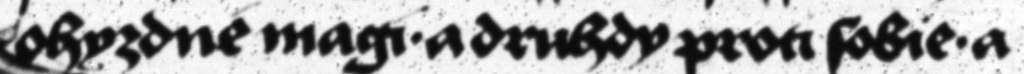ohyzdné magí. a druhdy proti ſobie. a
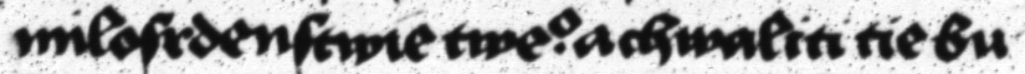miloſrdenstwíe twe° a chwaliti tie bu
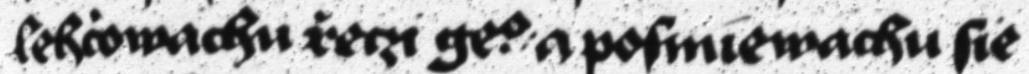lehċowachu řeczi ge°, a poſmíewáchu ſie
